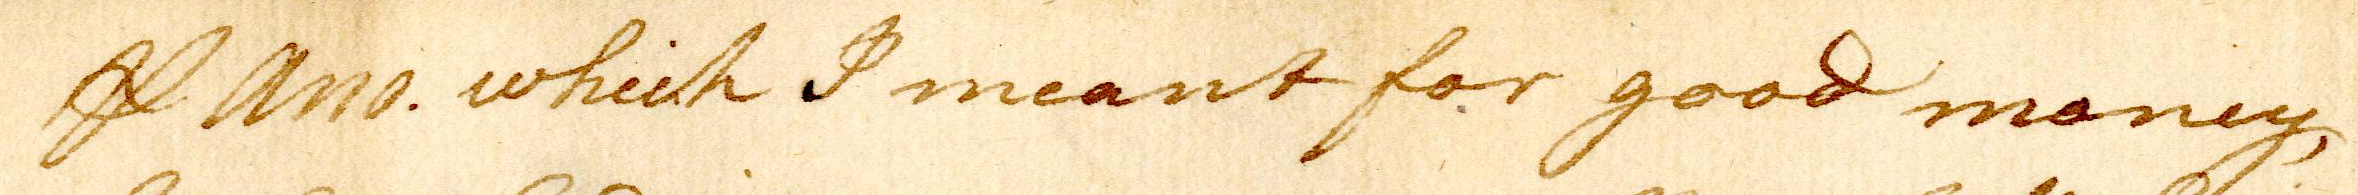per Ano which I meant for good money,
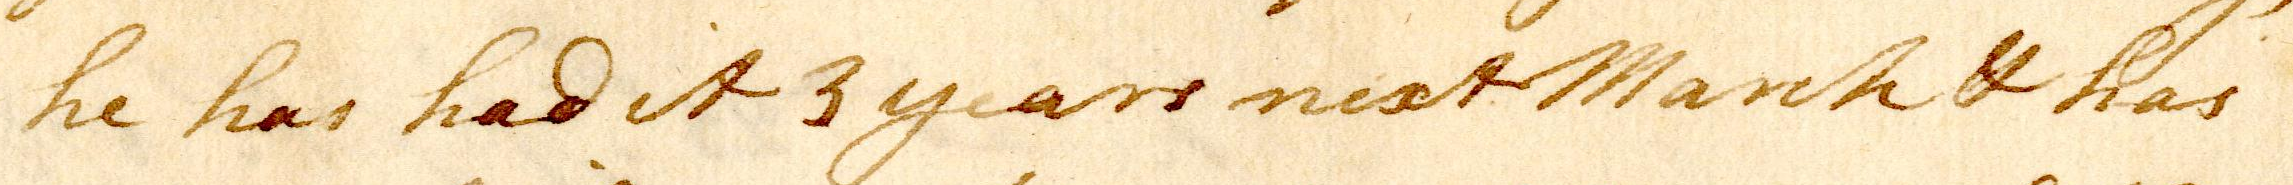he has had it 3 years next March & has
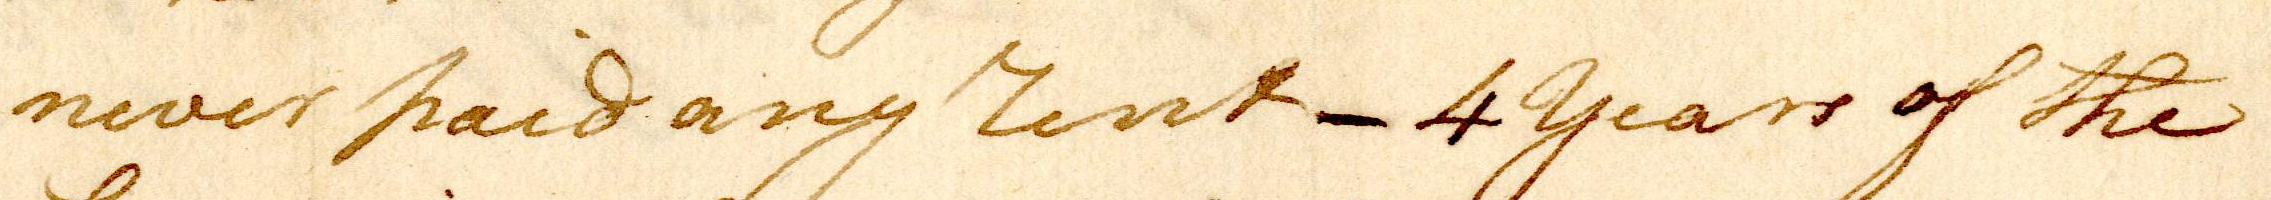never paid any rent. 4 years of the
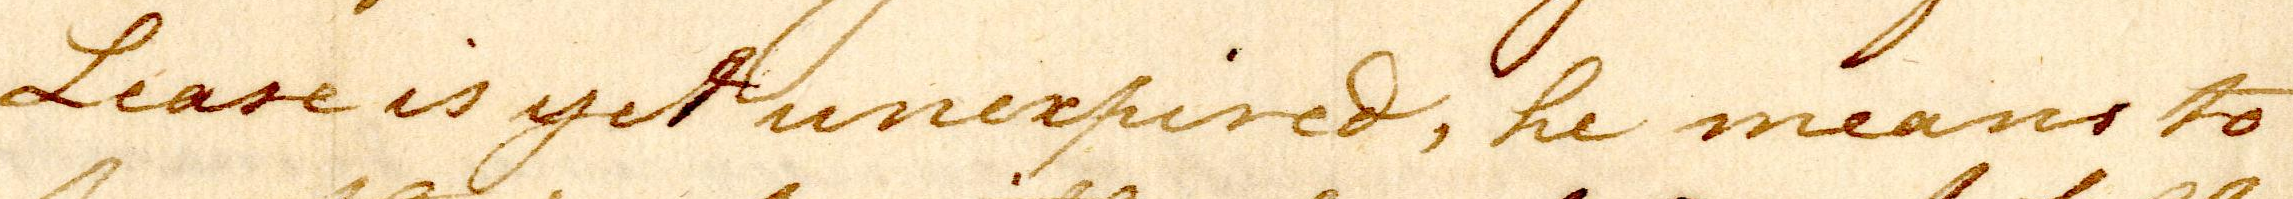Lease is yet unexpired, he means to
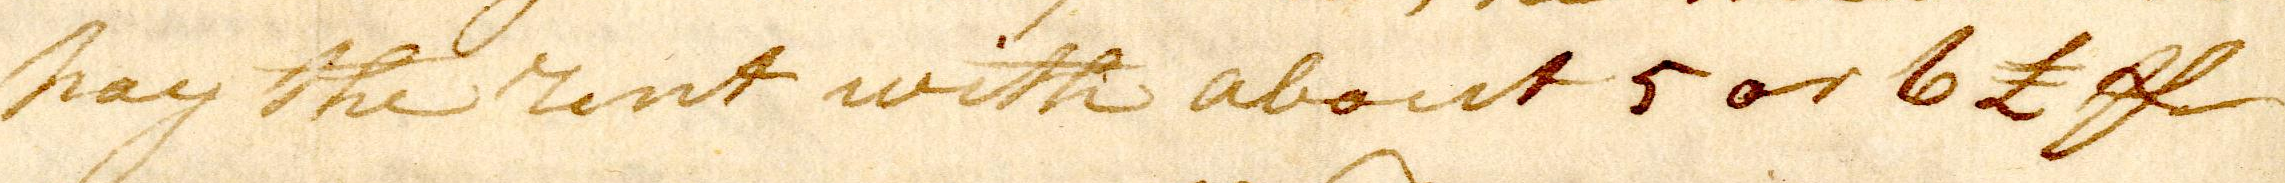pay the rent with about 5 or 6£ per
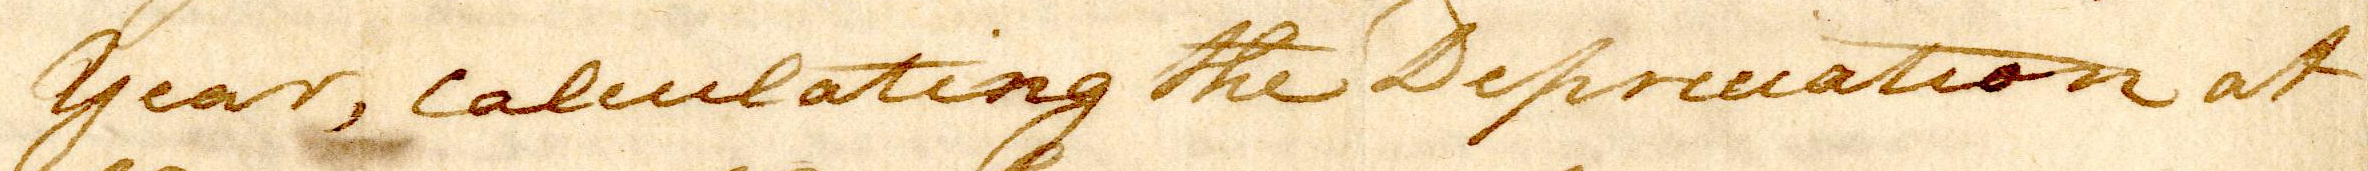year, calculating the Depreciation at
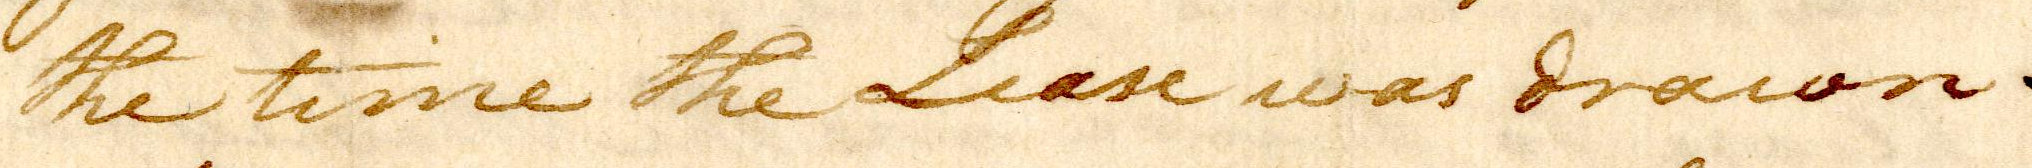the time the Lease was drawn
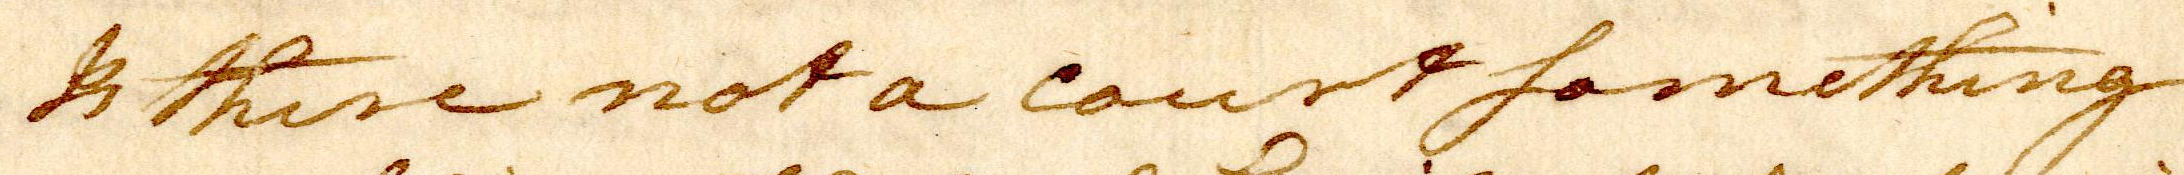Is there not a court & something
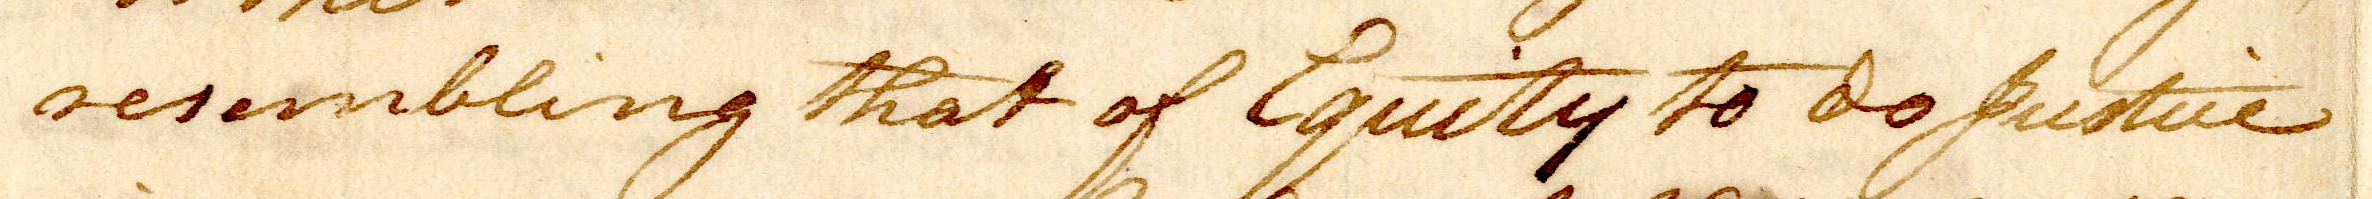resembling that of Equity to do justice
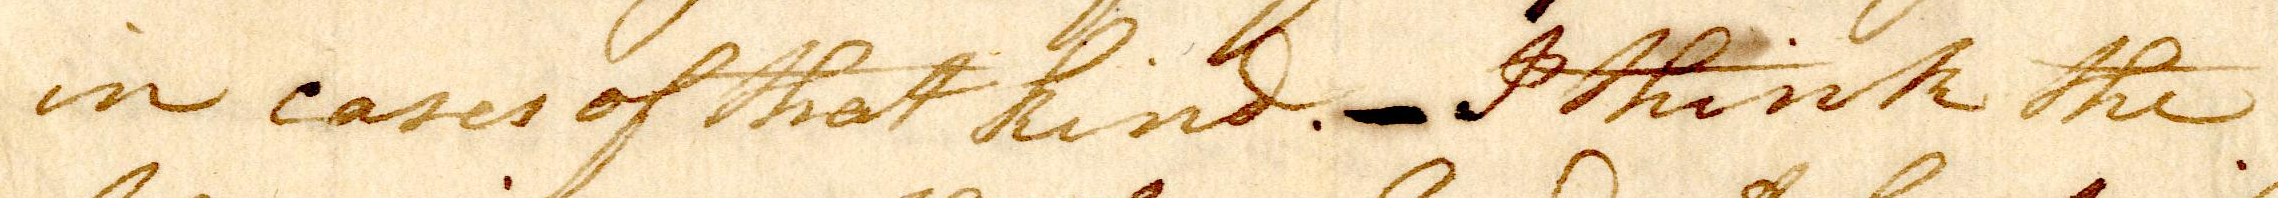in cases of that kind. I think the
